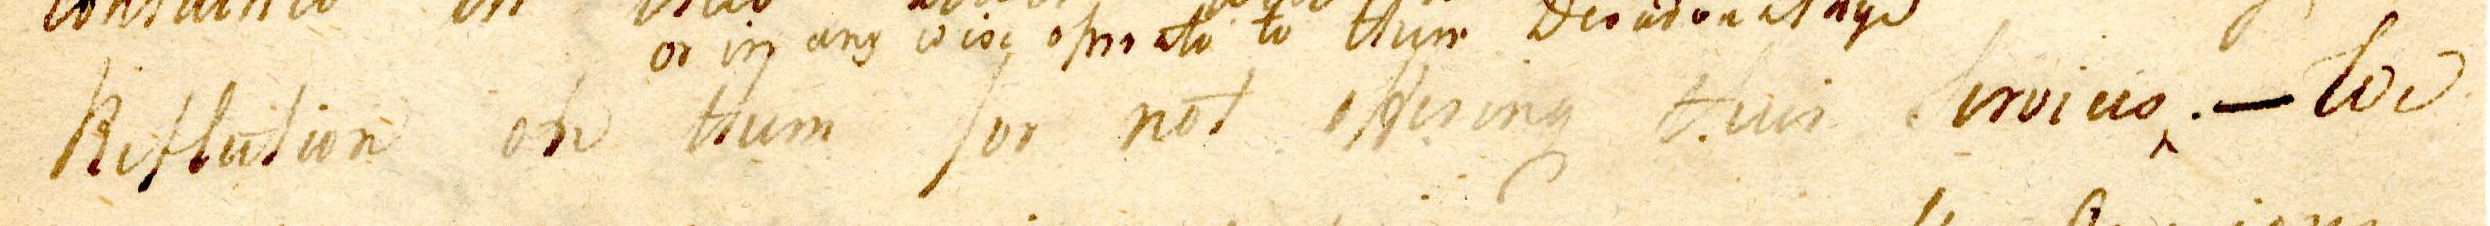Reflection on them for not offering their Services. We
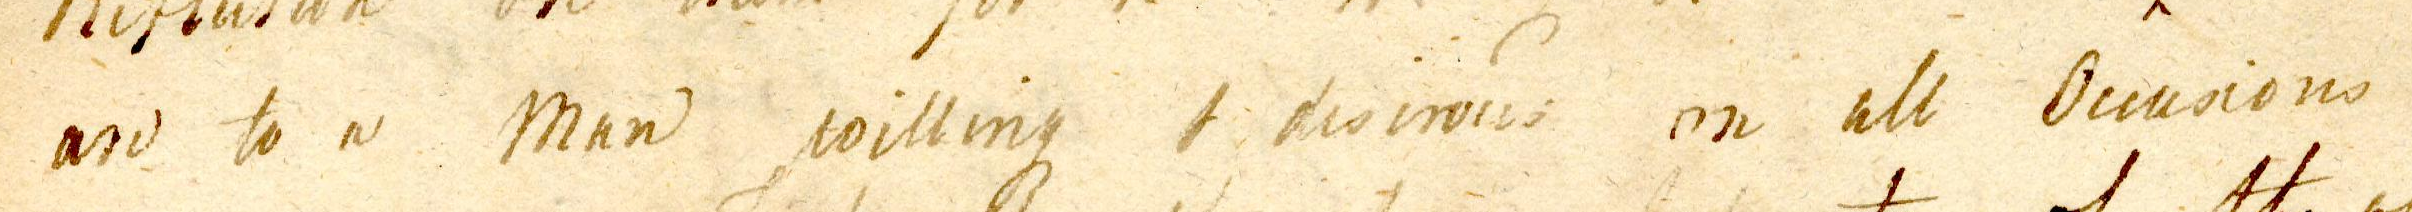are to a man willing & deserves on all Occasions
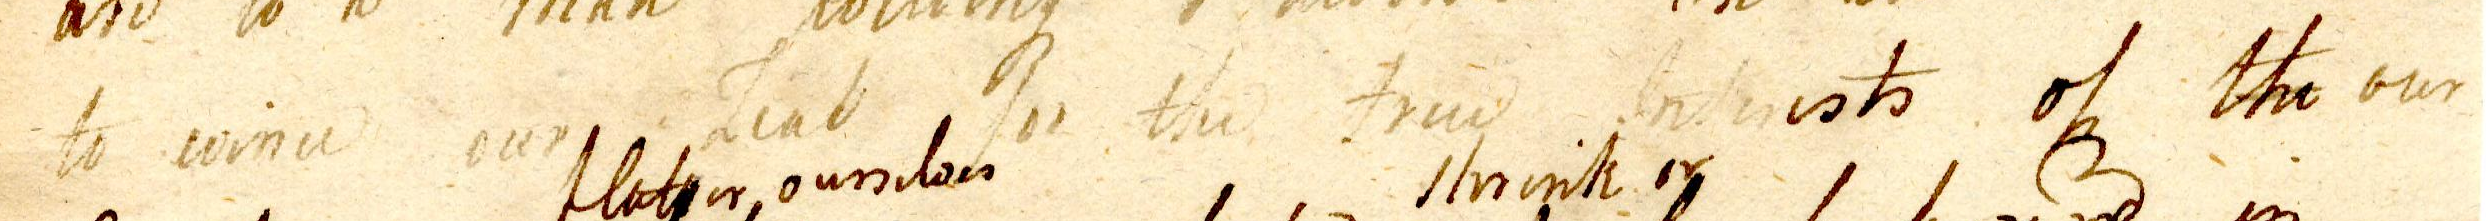to evince our Lead for the true Interests of the our
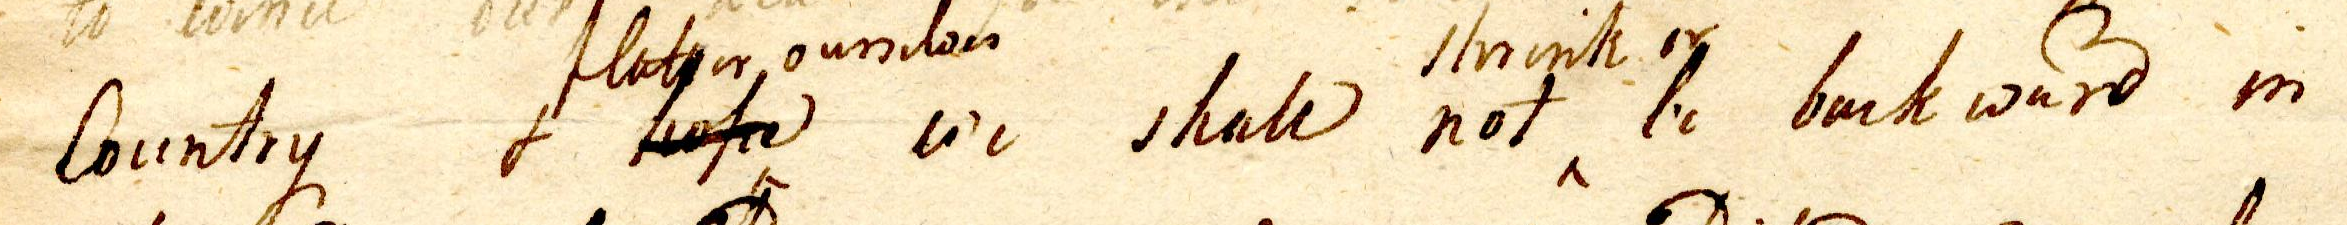Country & [hope] ^ we shall not ^ be backward in
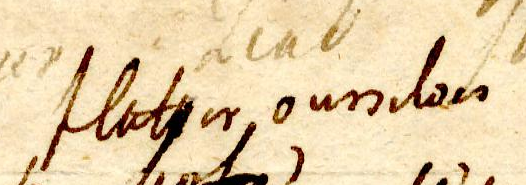flatter ourselves
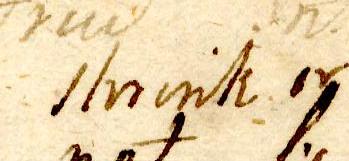think or
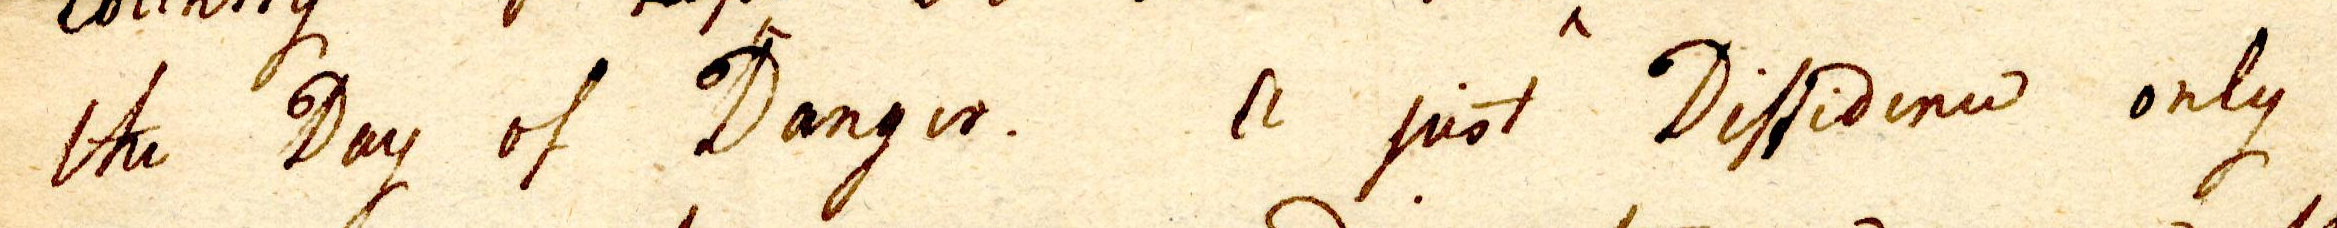the Day of Danger. A just Diffidence only
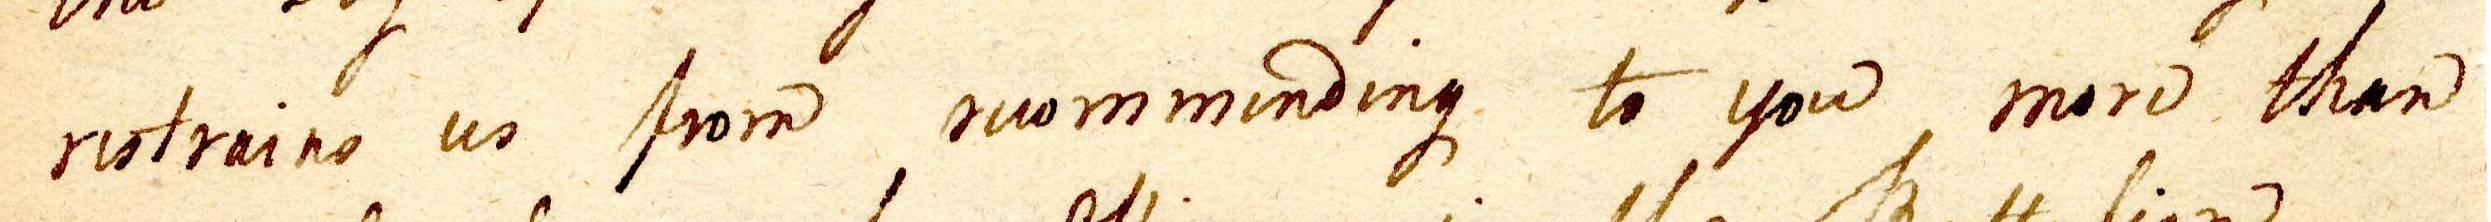restrains us from recommending to you more than
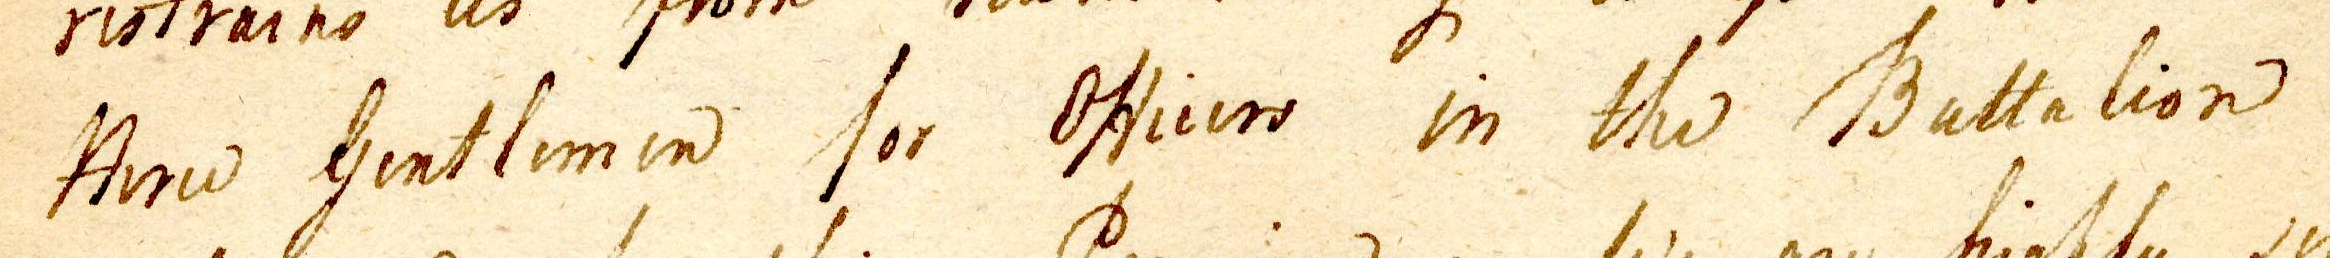three Gentlemen for Officers in the Battalion
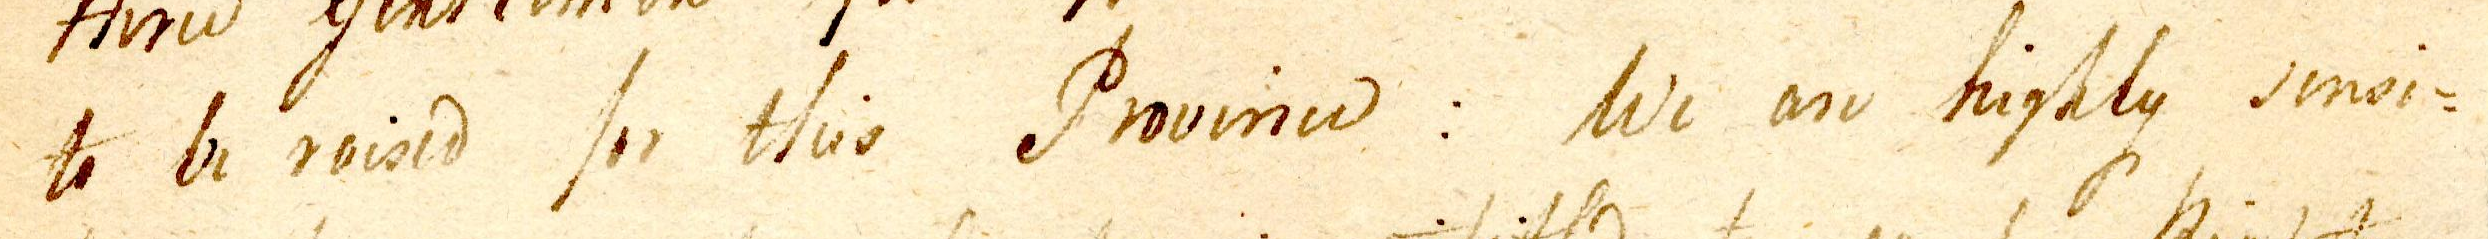to be raised for this Province: We are highly sensi-
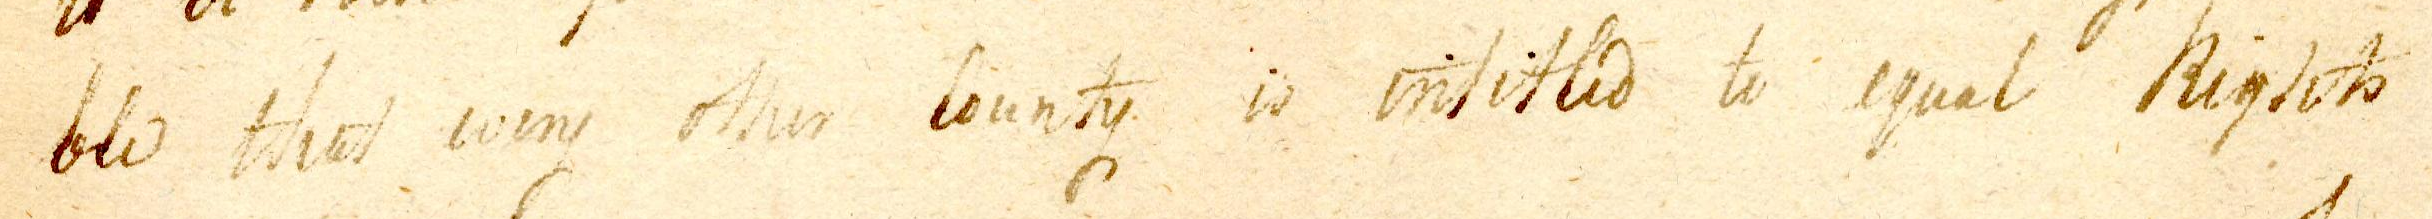-ble thet every other County is entitled to equal Rights
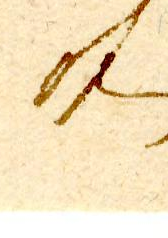of
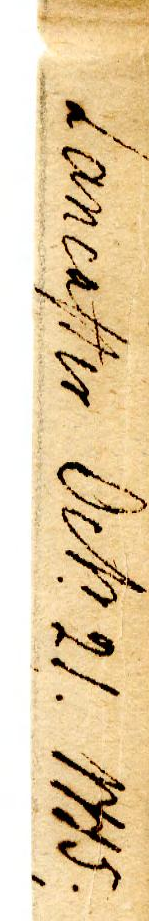Lancaster Oct^r. 21. 1775.
